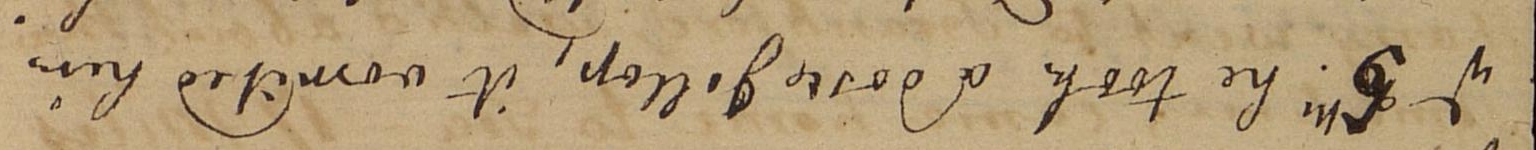y^e 5^th he took a dose Jollop, it vomited him
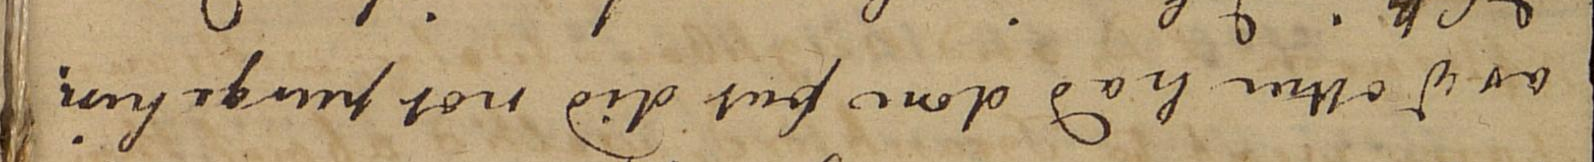as y^e other had done but did not purge him.
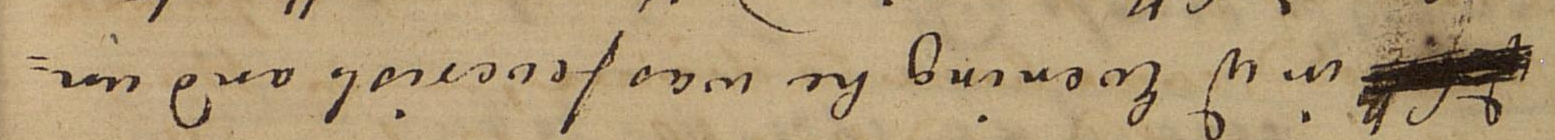[_____] in y^e Evening he was feverish and un-
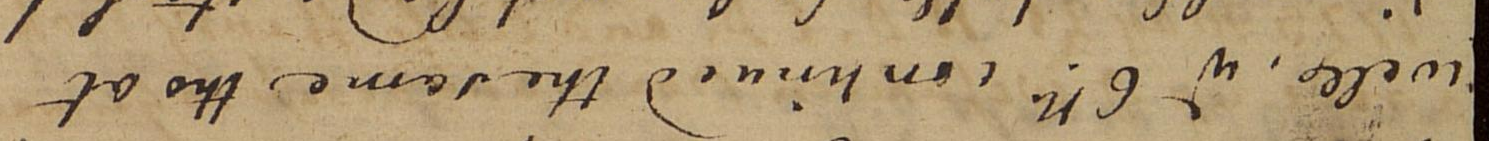well, y^e 6^th. continued the same tho at
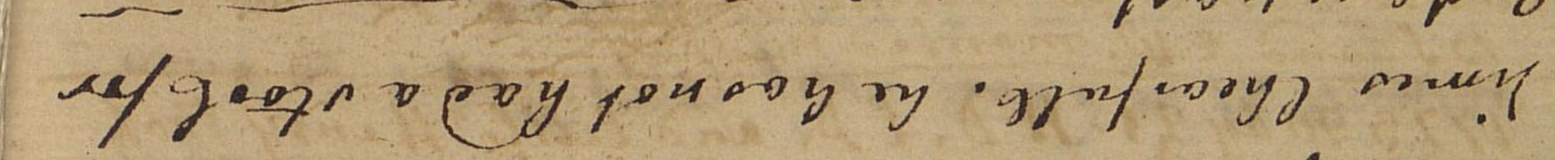times Chearfull. be has not had a stool for
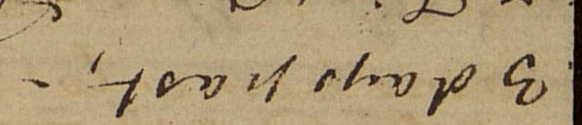3 days past,-
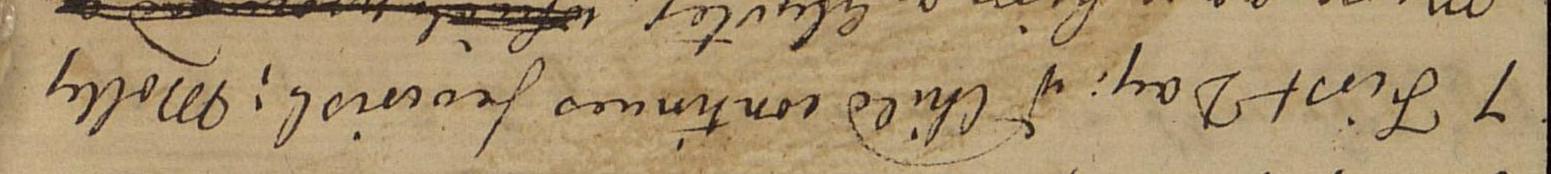7 First Day: y^e Child continues feverish; Molly
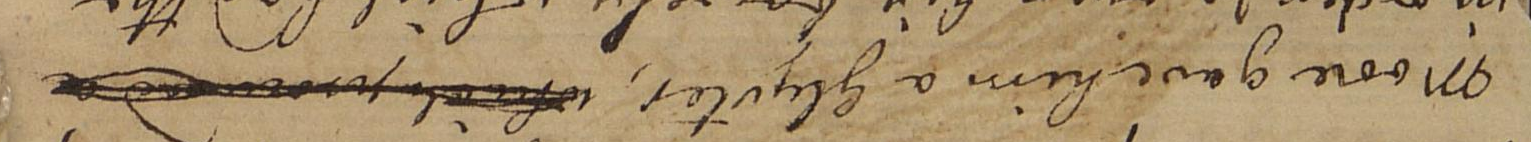Moore gave him a Glyster, [which produced a]
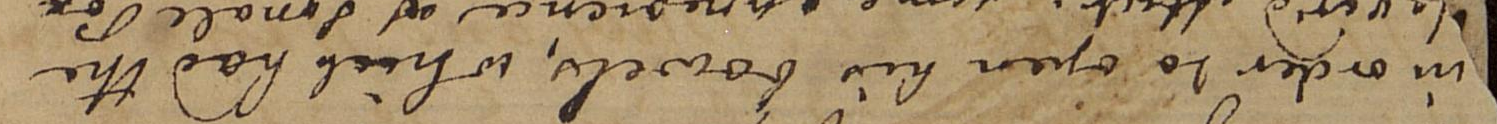in order to open his bowels, which had the
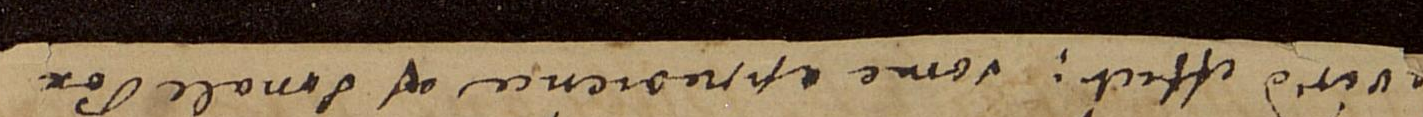sir'd effect; some appearence of Small Pox
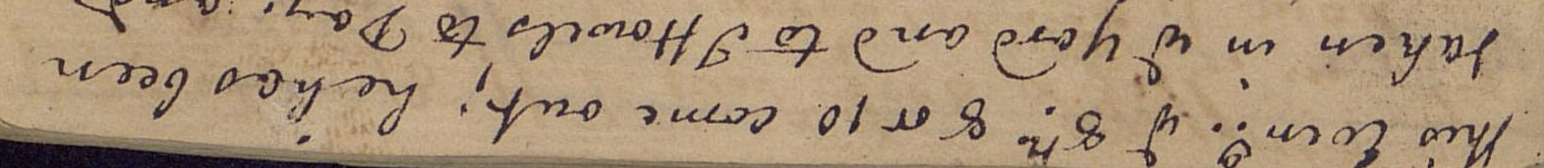this Even^g.. y^e 8^th. 8 or 10 come out; he has been
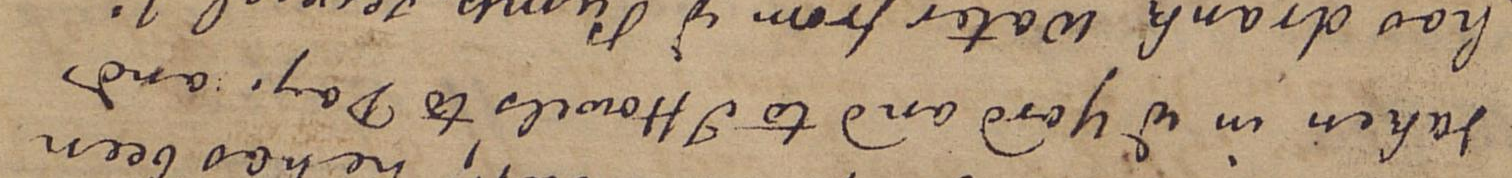taken in y^e yard and to J Howels to Day. and
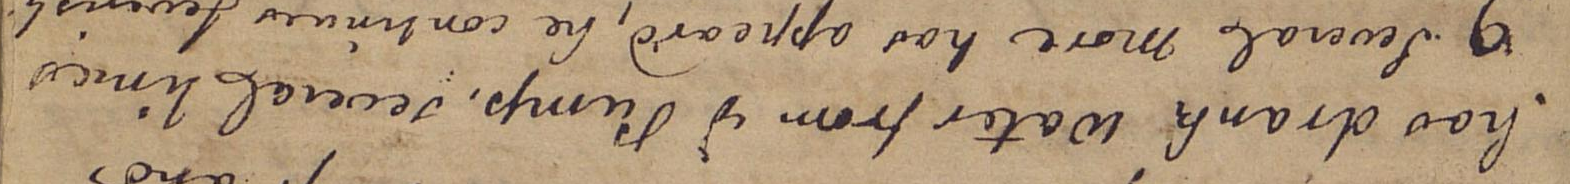has drank water from y^e Pump, several times
